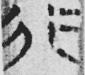行
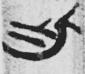此
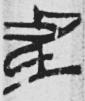者
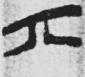亓（其）
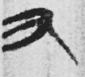又（有）
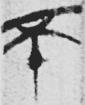不
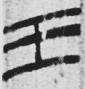王
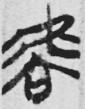唬（乎）
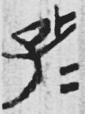孔子
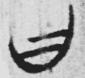曰
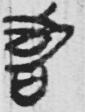○（詩）
